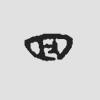四
